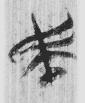民
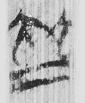并
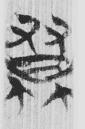{友日䖵}
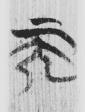而
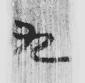九
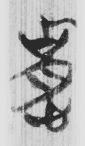悁
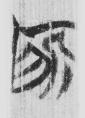所
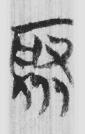聚
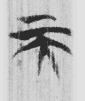天
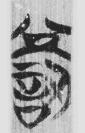罰
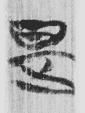是
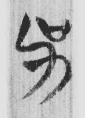加
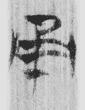甬
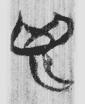兇
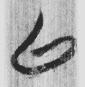㠯（以）
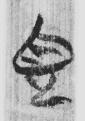見
